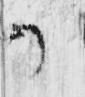人
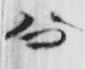公
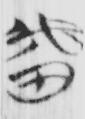番
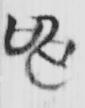申
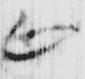㠯（以）
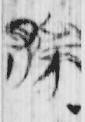責
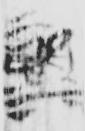○（遣）
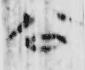公
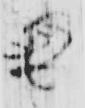朔
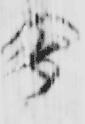宵
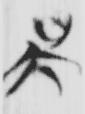吳
